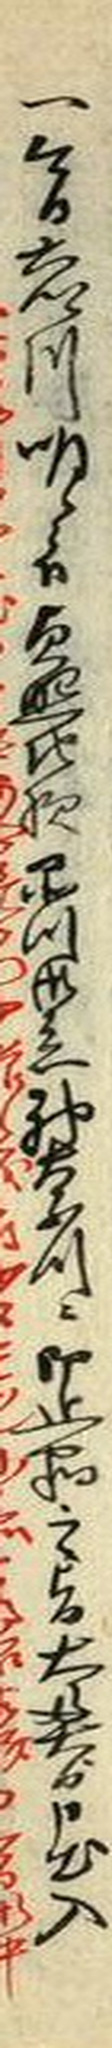一今日六郷川明候ニ付貞照院様品川御立神奈川ニ御止宿之旨大奥ゟ申出入
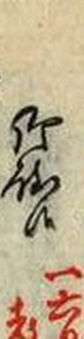御聴候
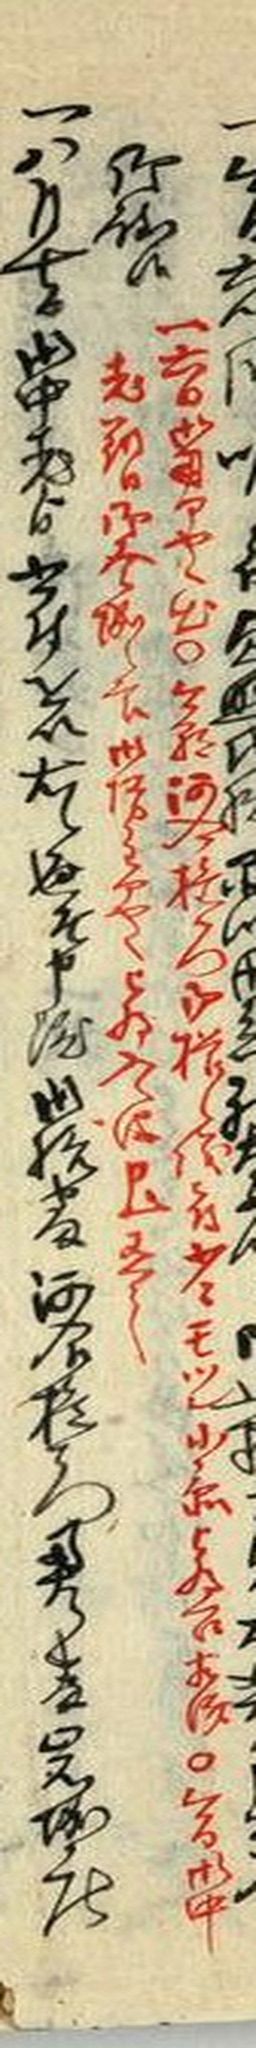一八月七日御中老ゟ書付を以左之通被申渡御膳番河合権右衛門奥之番岩城庄
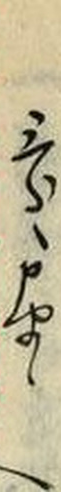三郎へ申聞候
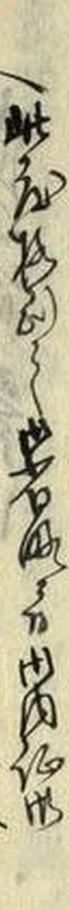此度格別之御省略中ニ付御内証御
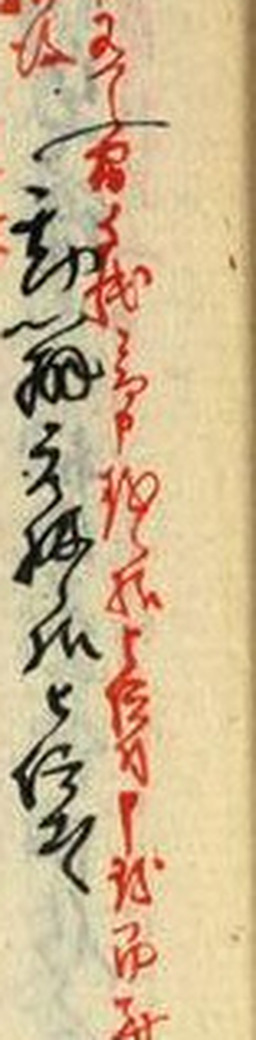勘弁取扱候様仰出候
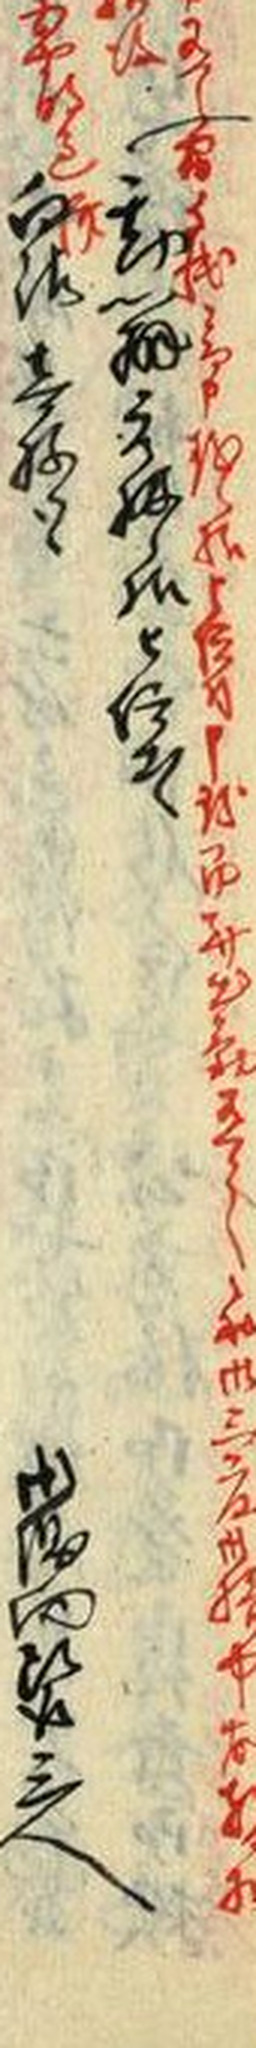白銀壱枚ツゝ御側向頭取参人
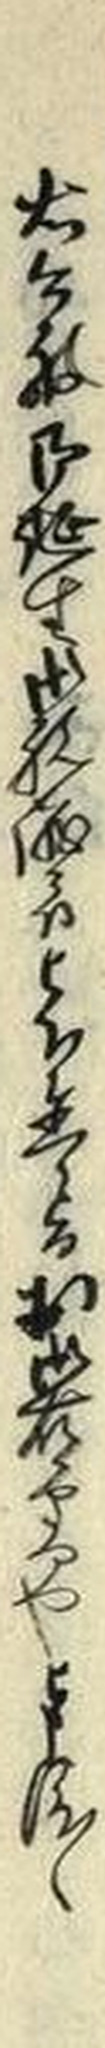右今般御誕生御祝儀ニ付被下置候間於御右筆部や被申渡候
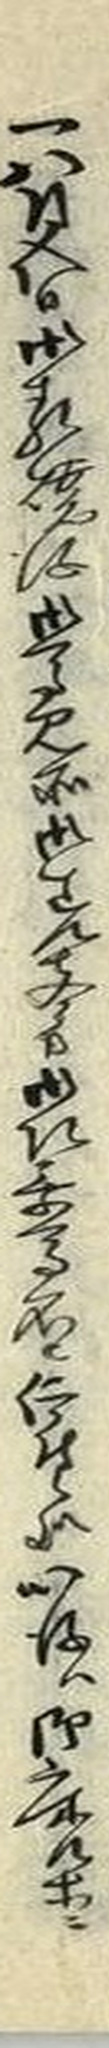一八月八日御類焼後御馬見所御差支ニ付御次乗馬不被仰付候処以後ハ御床几等ニ
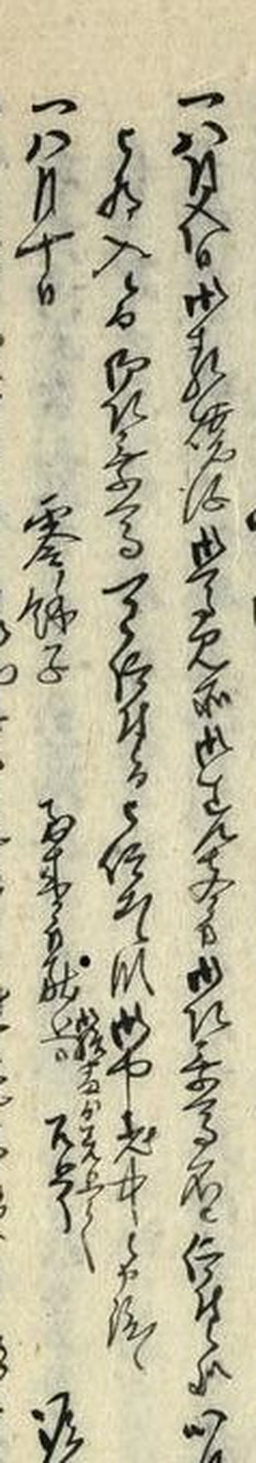被為入候而御次乗馬可被仰付旨被仰出候段御中老中被申渡候
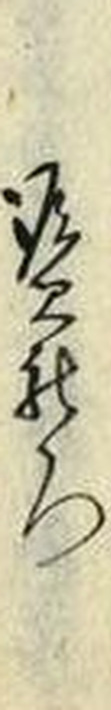渥美新右衛門
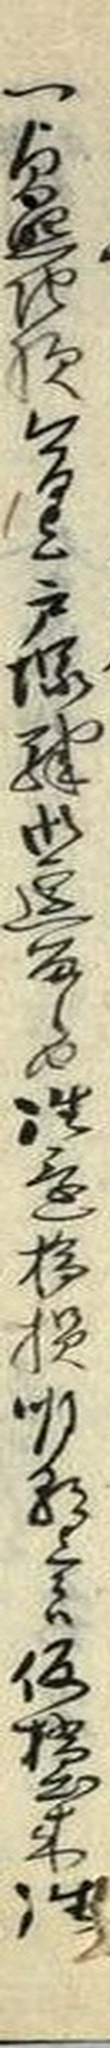一貞照院様今日迄戸塚駅御逗留之由往還橋損明朝迄ニハ仮橋出来往
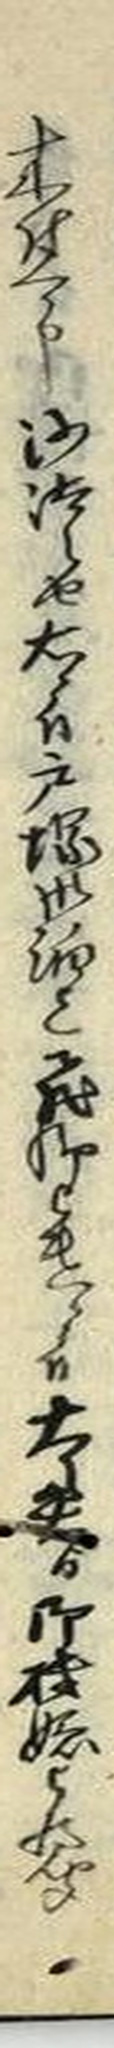来付可申沙汰之由右ニ付戸塚御泊迄飛脚被遣候ニ付大奥ゟ御機嫌被為聞
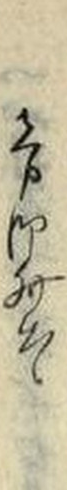旁御文出候

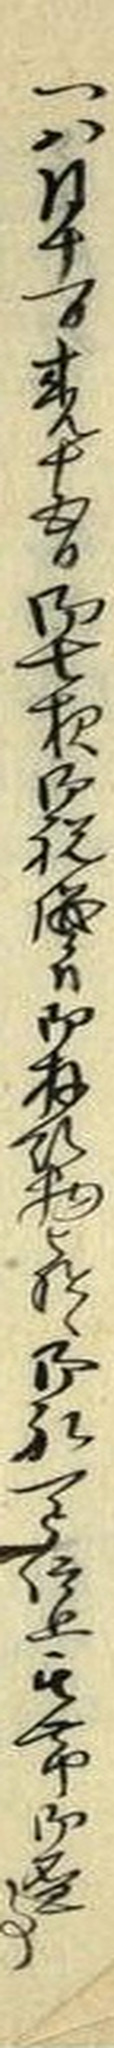一八月十一日来ㇽ十五日御七夜御祝儀ニ付御拝領物被遊候御礼可被仰上其節御盃事
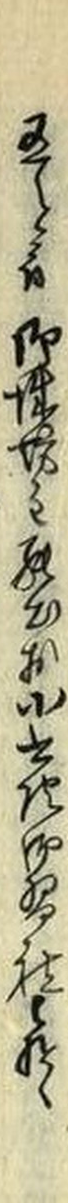有之候ニ付御城坊主罷出於小書院御習礼被遊候
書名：少傅日録抄（斉承付側向頭取日記、在府）
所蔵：福井県文書館 Fukui Prefectural Archives
